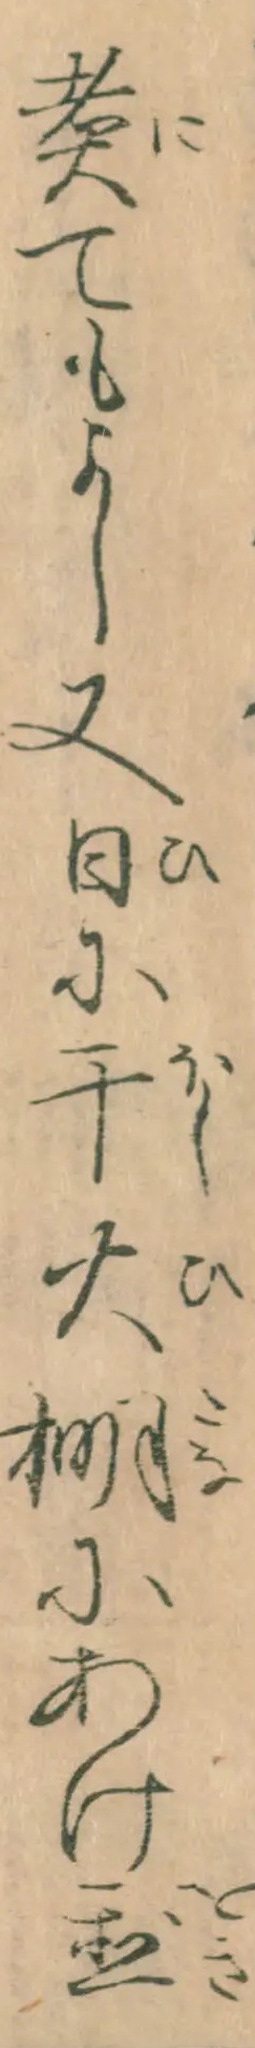煮てもよし又日に干火棚にあけ置
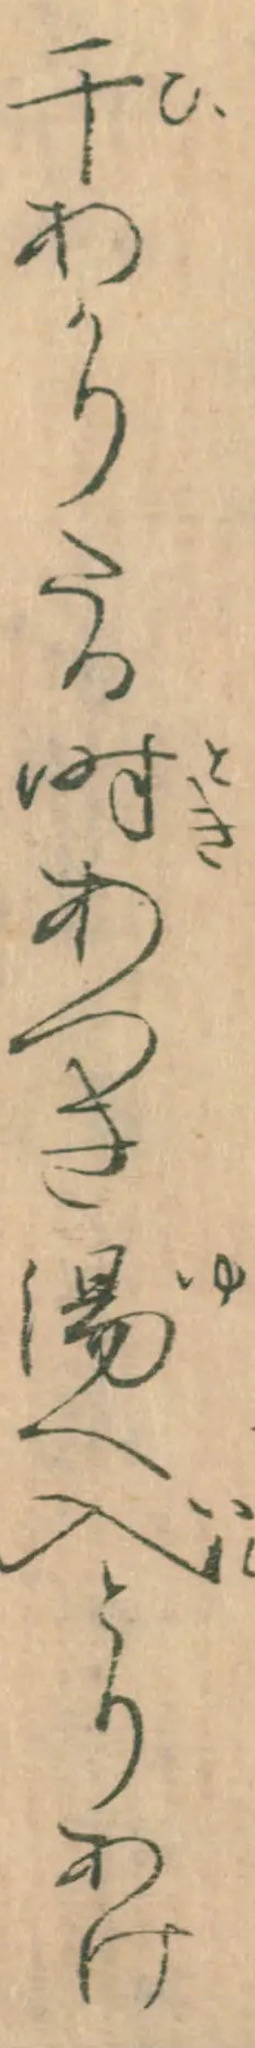干あかりたる時あつき湯へ入とりあけ
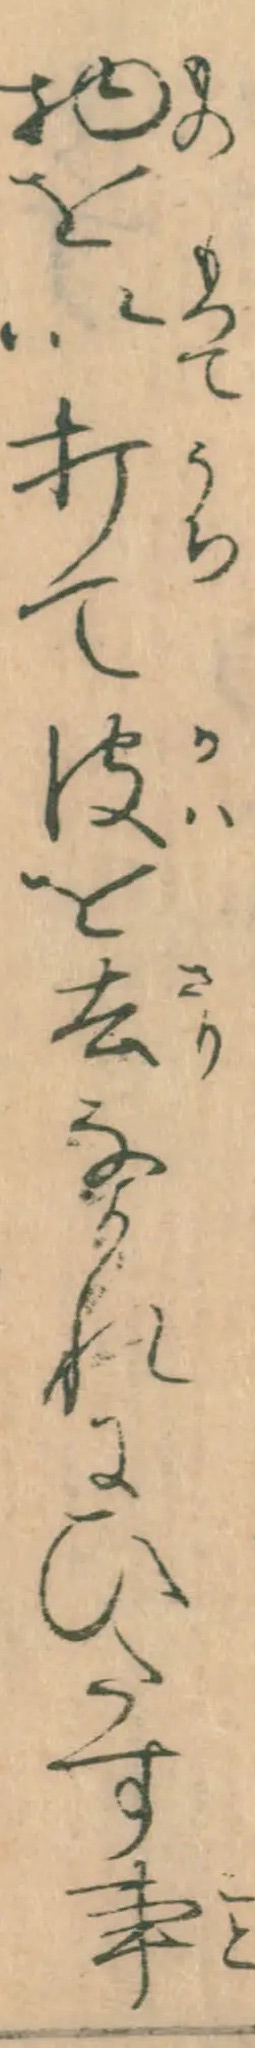物を以打て皮を去なかれにひたす事
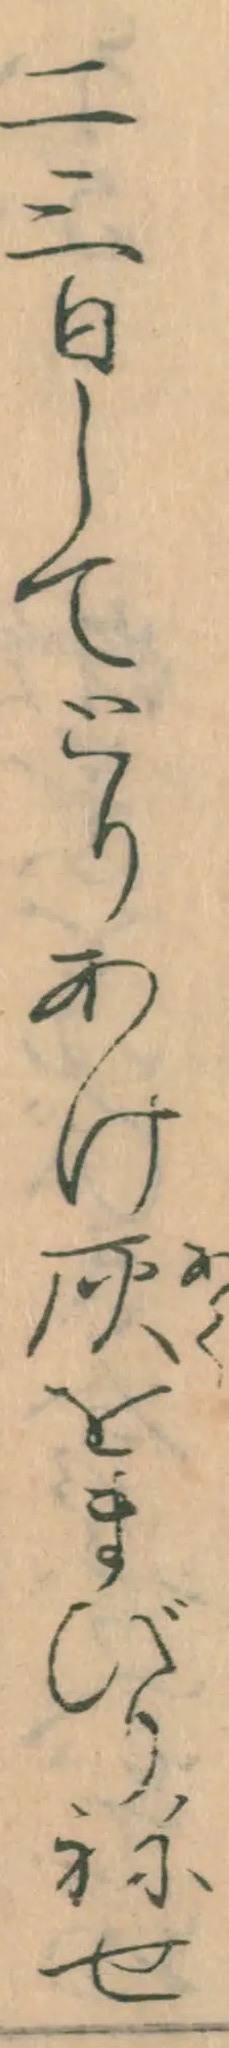二三日してとりあけ灰をまびりねせ
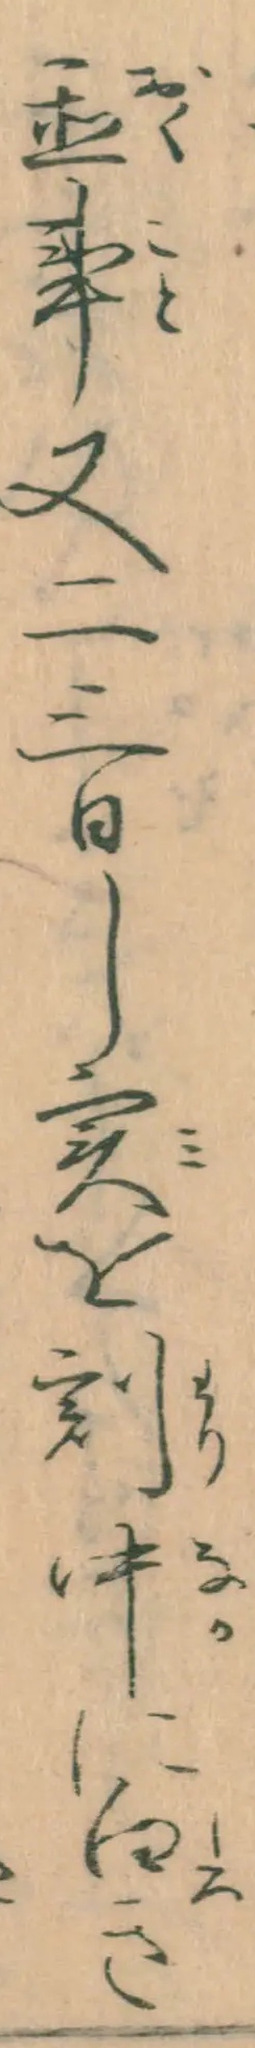置事又二三日し実を割中に白き
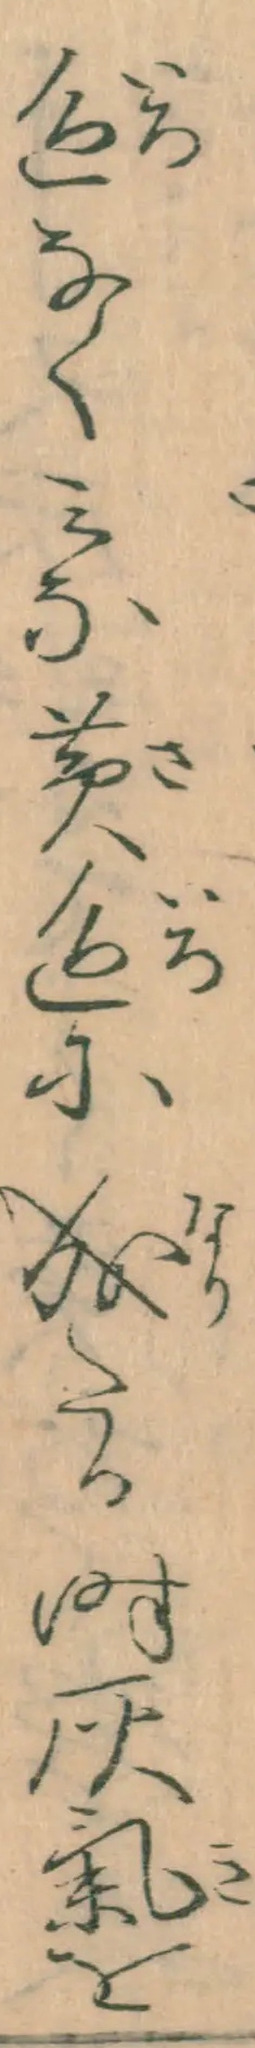色なくみな黄色に成たる時灰気を
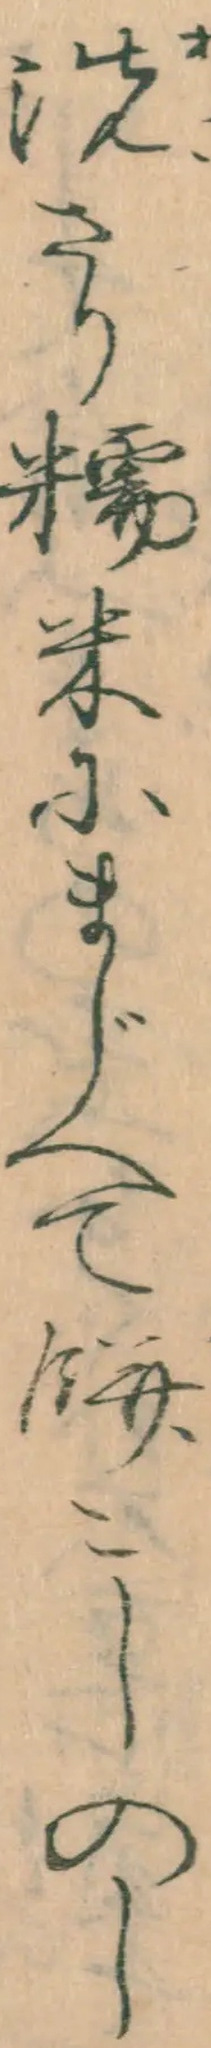洗さり糯米まじへて餅としのし
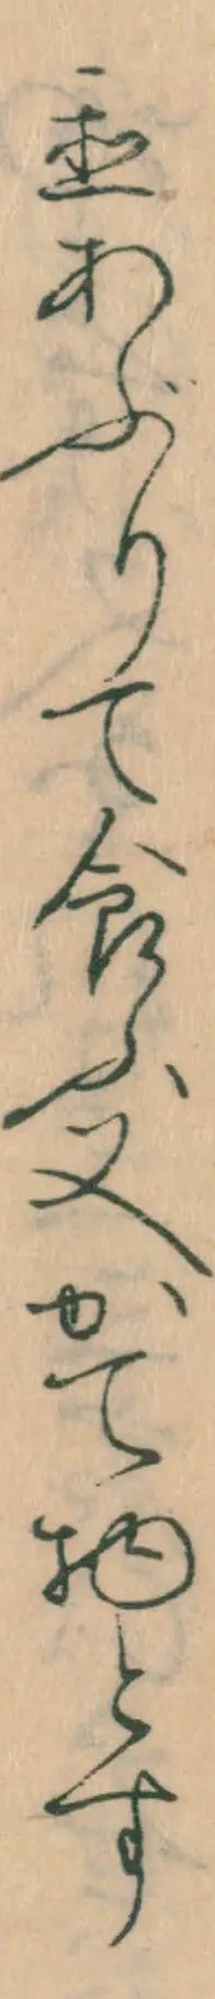置あぶりて食ふ又かて物とす
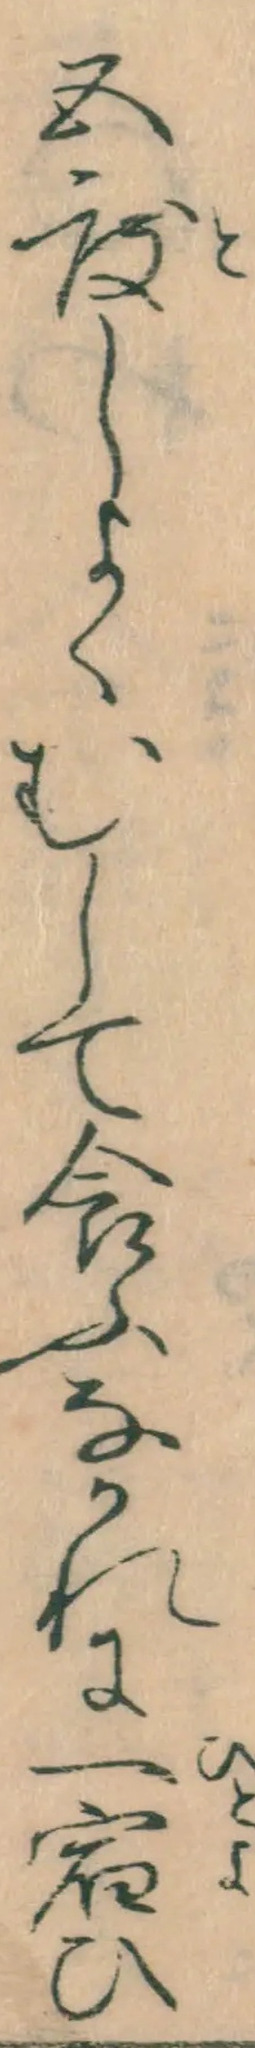五度しよくむして食ふなかれに一宿ひ
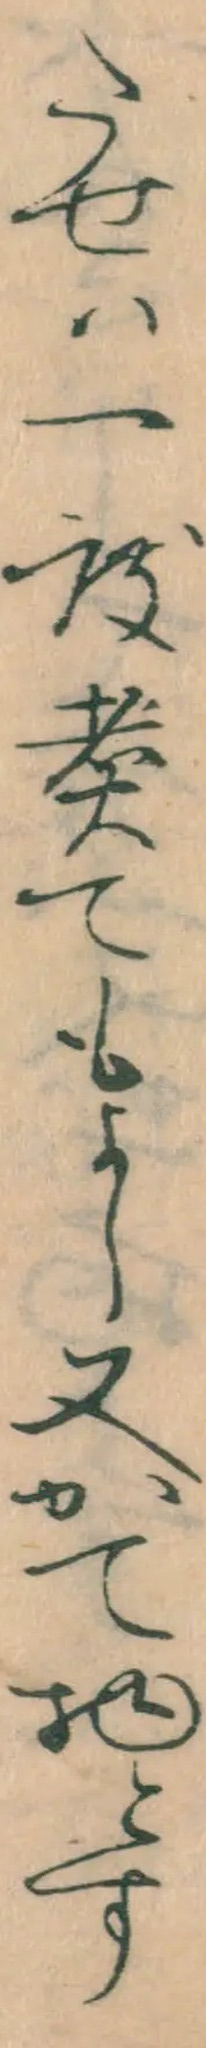たせは一度煮てもよし又かて物とす
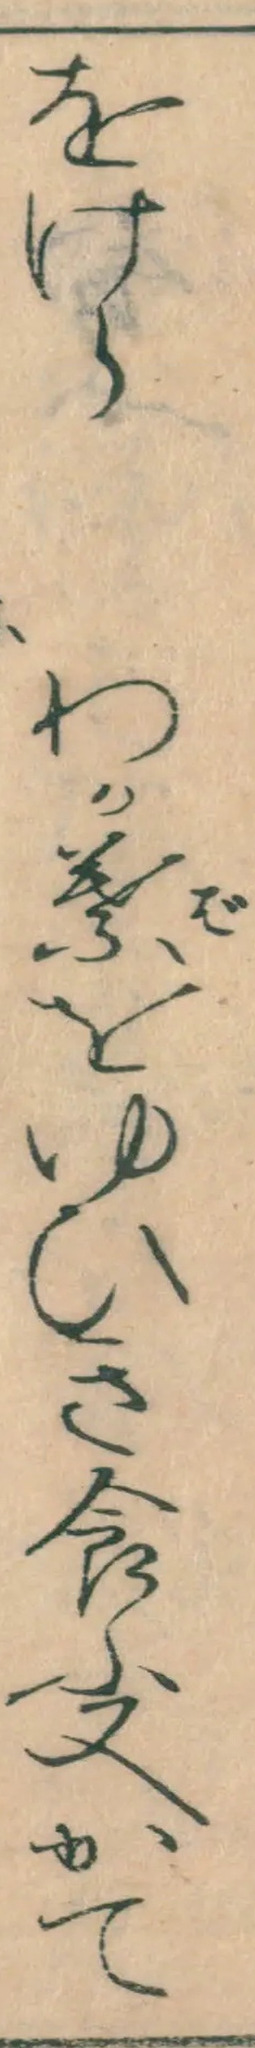をけらわか葉をゆひき食ふ又かて
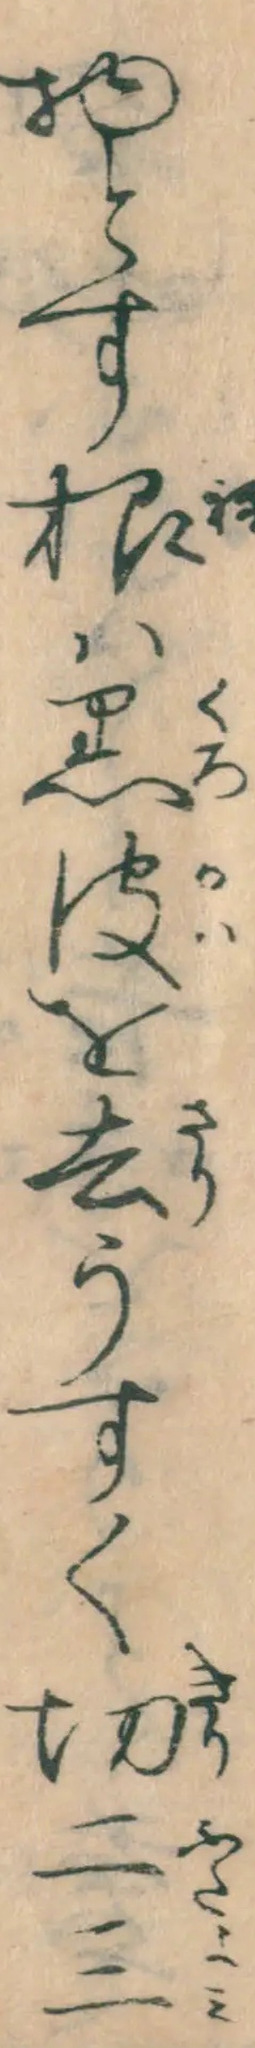物とす根は黒皮を去うすく切二三

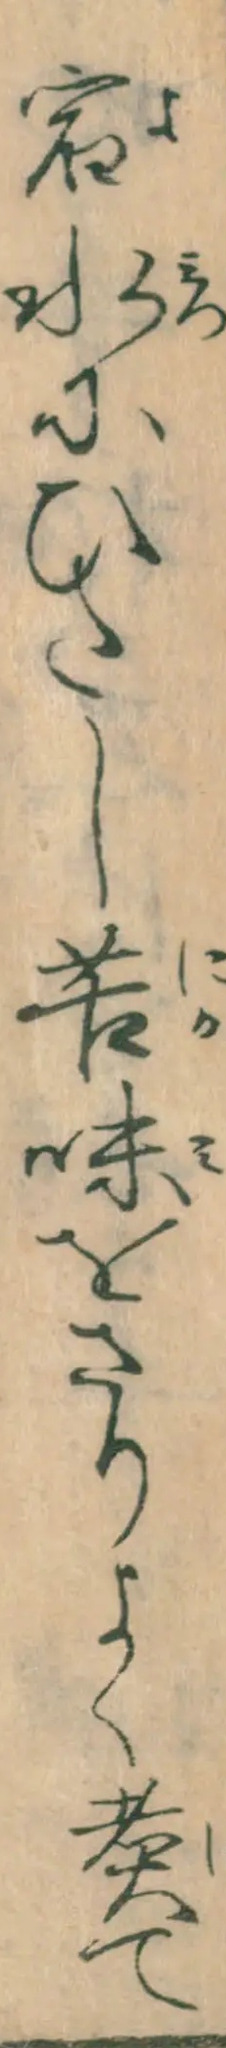宿水にひたし苦味をさりよく煮て
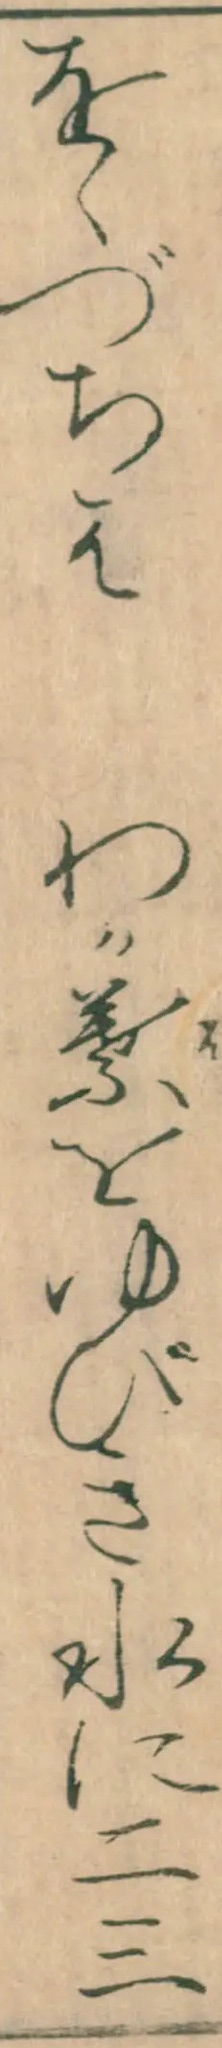をゝづちはわか葉をゆびき水に二三
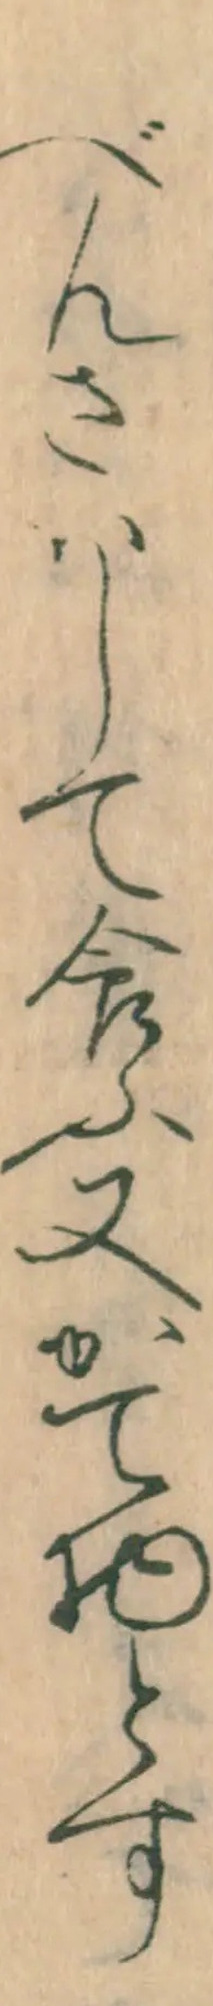べんさはして食ふ又かて物とす
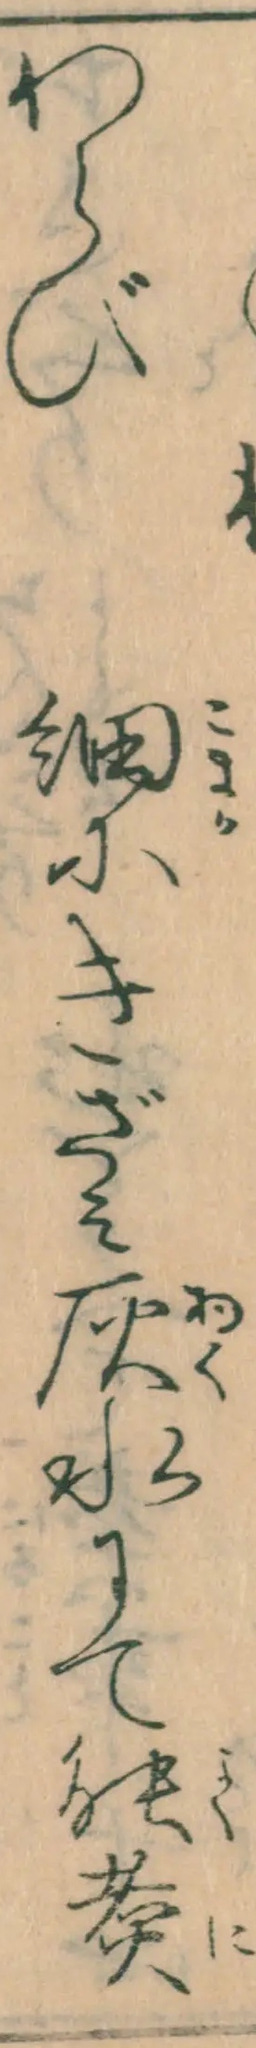わらび細にきざみ灰水にて能煮
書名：かてもの
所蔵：国立国会図書館 National Diet Library, JAPAN
